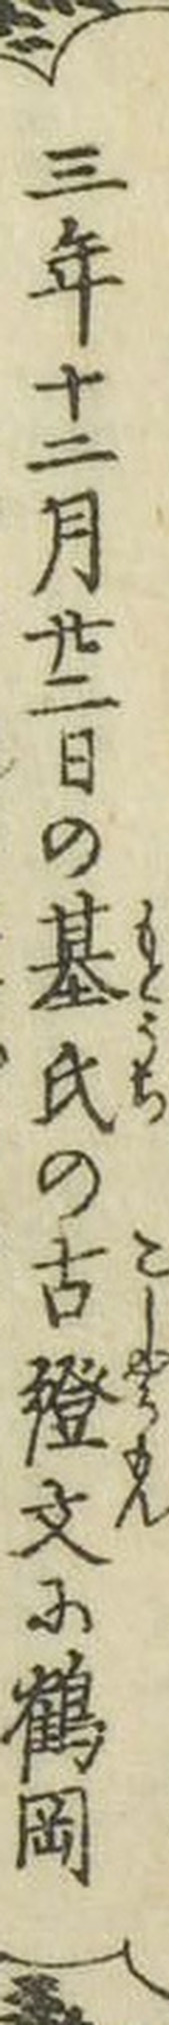三年十二月廿二日の基氏の古証文に鶴岡
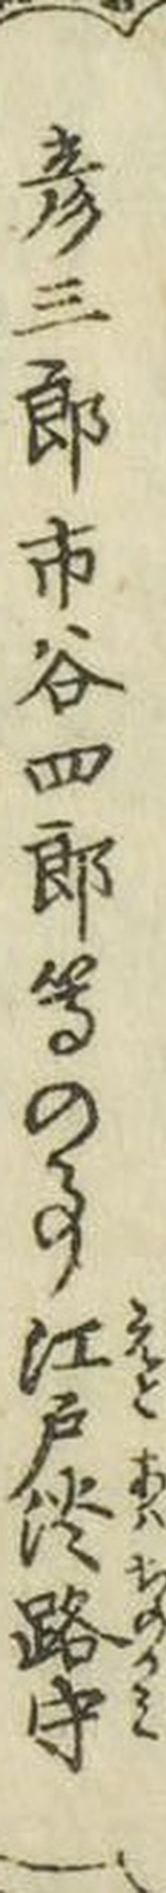彦三郎市谷四郎等の事江戸淡路守
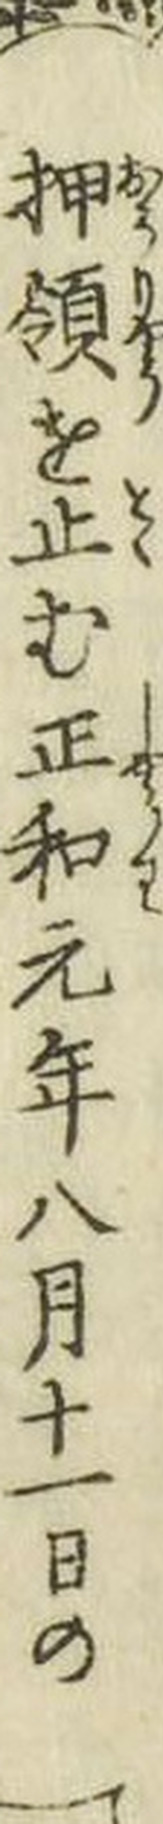押領を止む正和元年八月十一日の
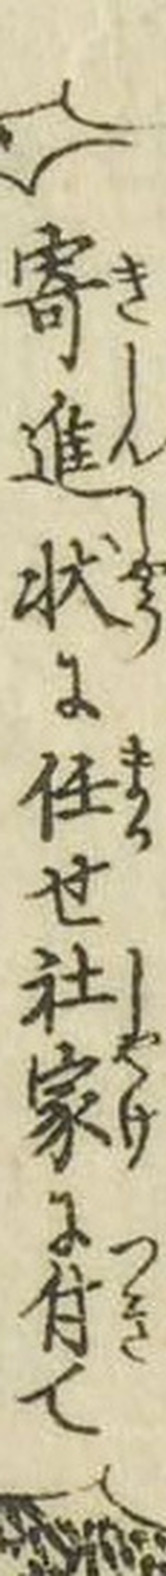寄進状に任せ社家に付て
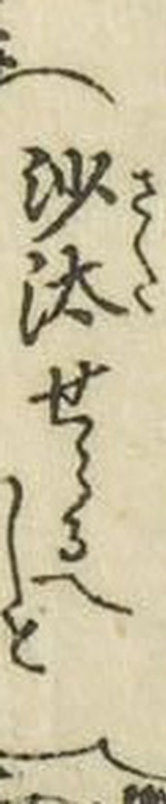沙汰せらるへしと
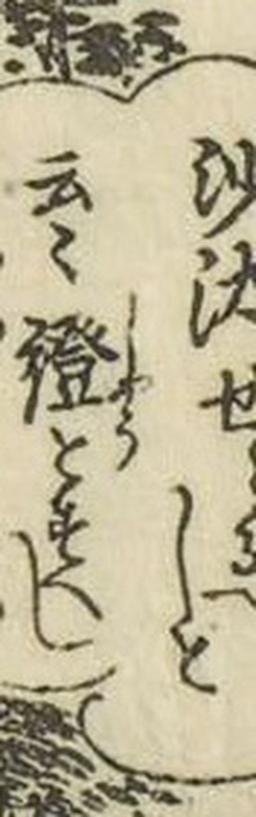云々証とすへし
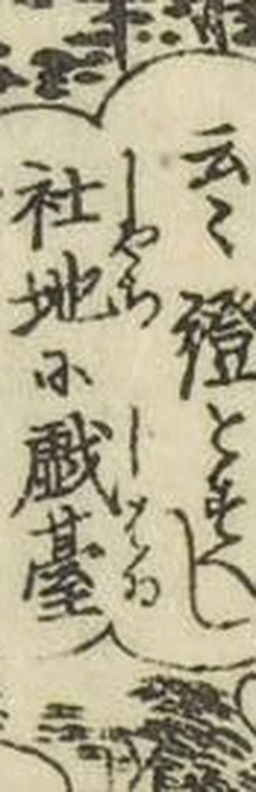社地に戯台
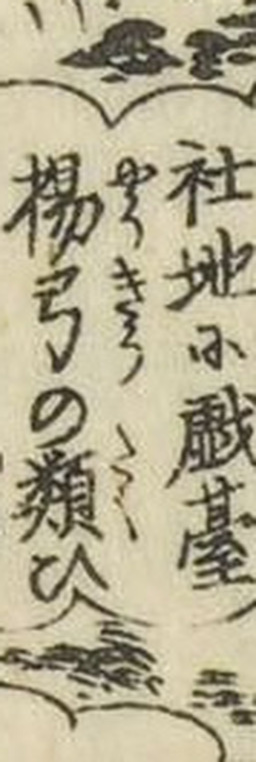楊弓の類ひ
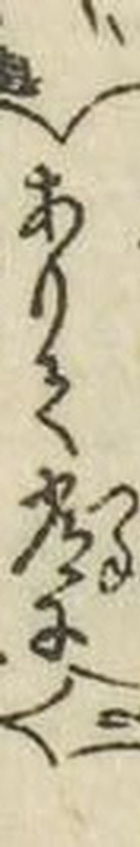ありて常に
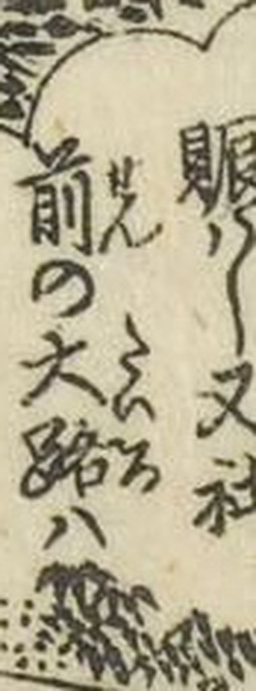前の大路は
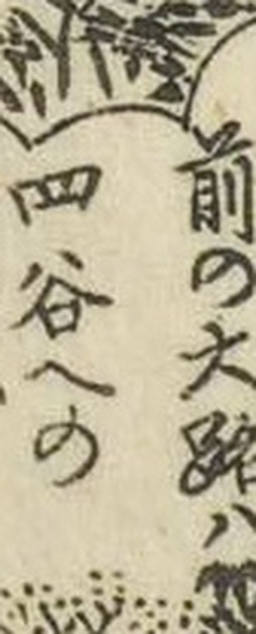四谷への
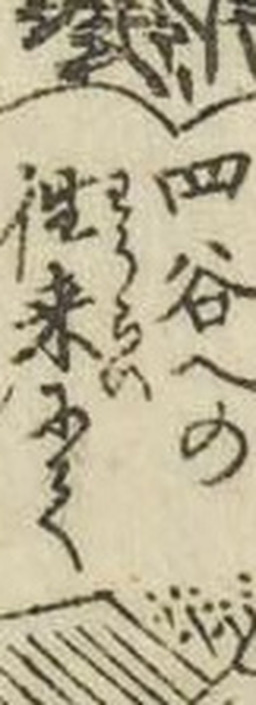往来にて

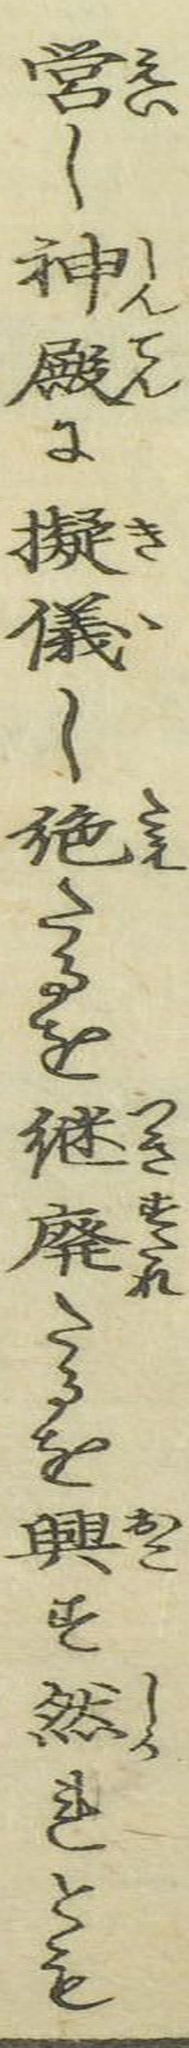営し神殿に擬儀し絶たるを継廃たるを興す然れとも
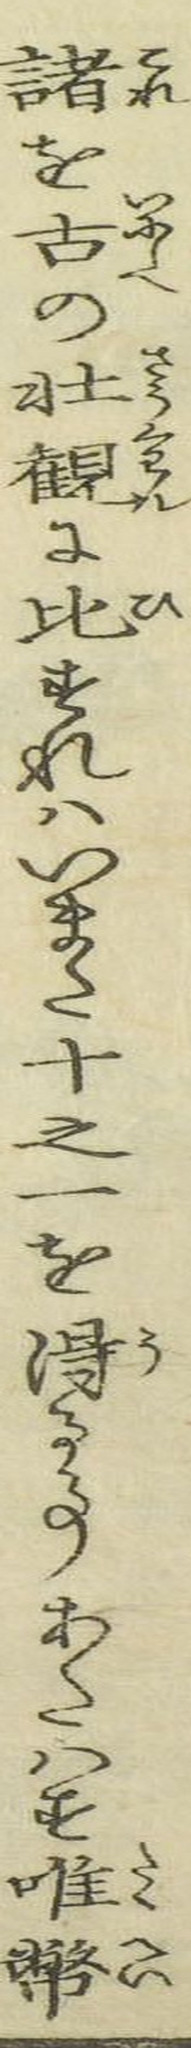諸を古の壮観に比すれはいまた十之一を得る事あたはす唯幣
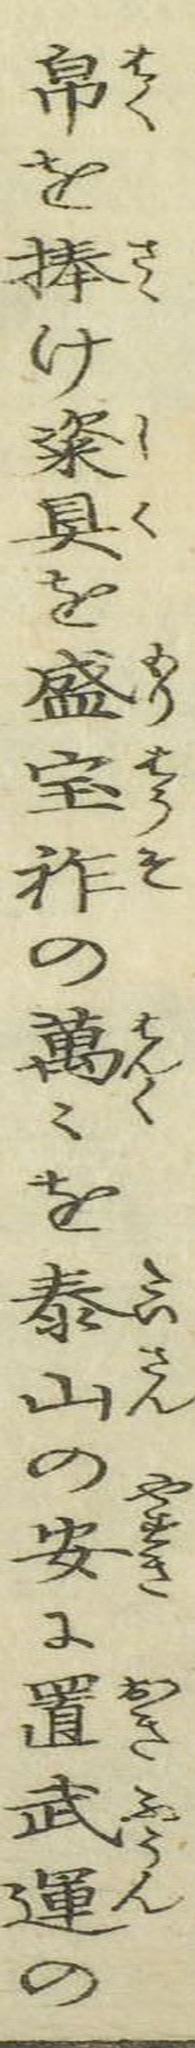帛を捧け粢具を盛宝祚の萬々を泰山の安に置武運の
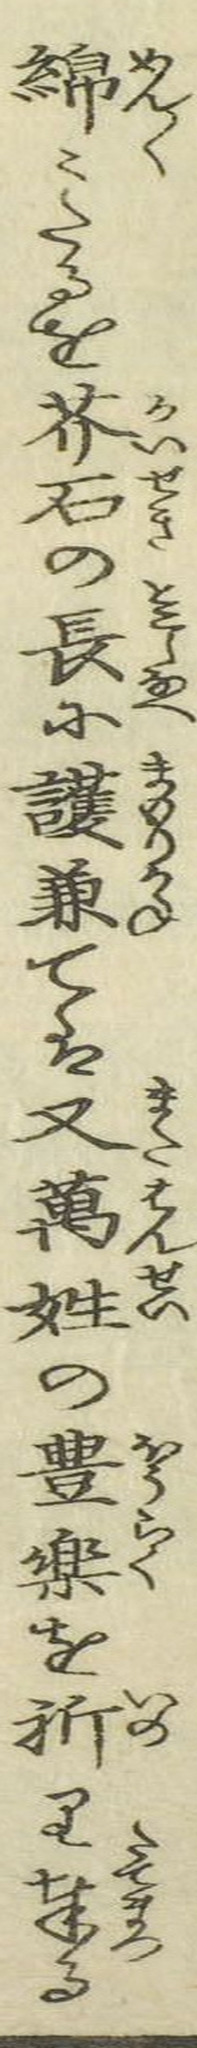綿々たるを芥石の長に護兼ては又萬姓の豊楽を祈り奉る
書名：江戸名所図会 20巻 巻之11
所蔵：東京学芸大学教育コンテンツアーカイブ
